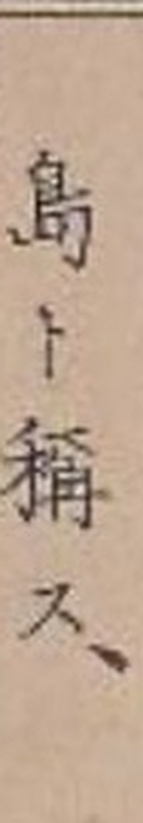島ト称ス、
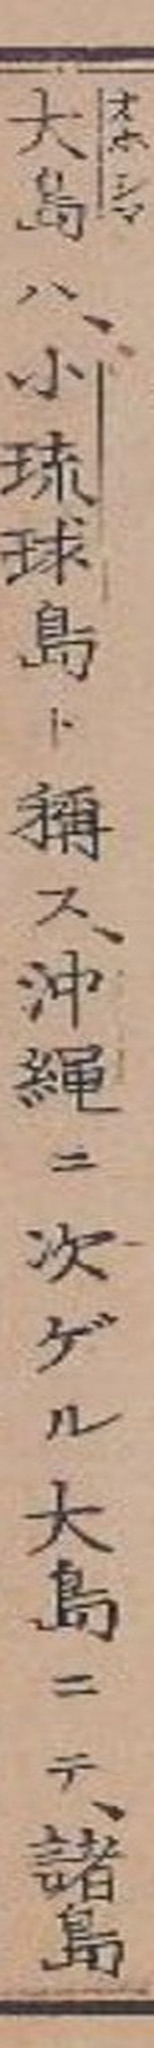大島ハ、小琉球島ト称ス、沖縄ニ次ゲル大島ニテ、諸島

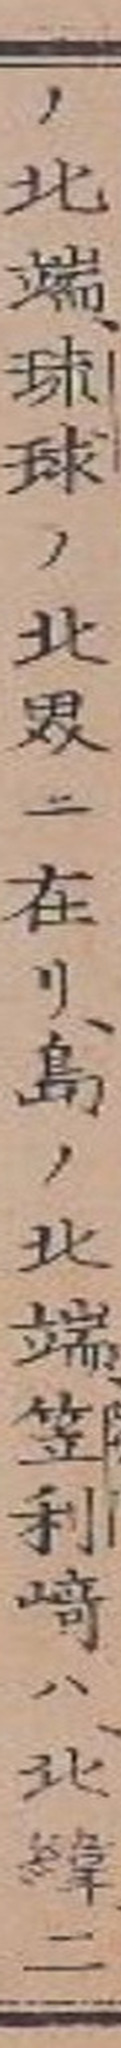ノ北端、琉球ノ北界ニ在リ、島ノ北端、笠利崎ハ、北緯二
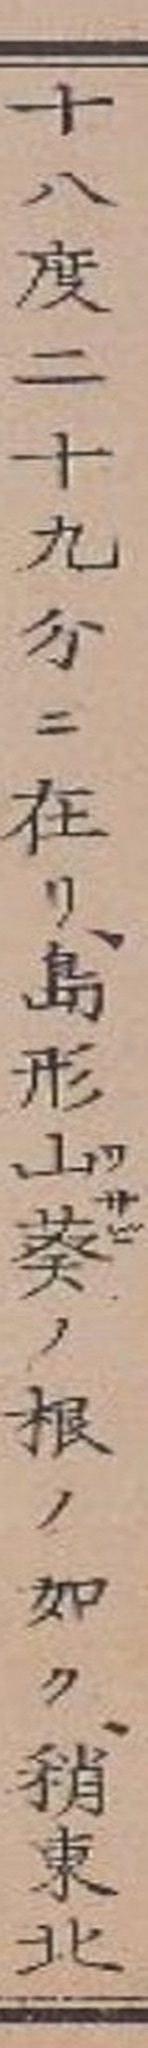十八度二十九分ニ在リ、島形山葵ノ根ノ如ク、稍東北
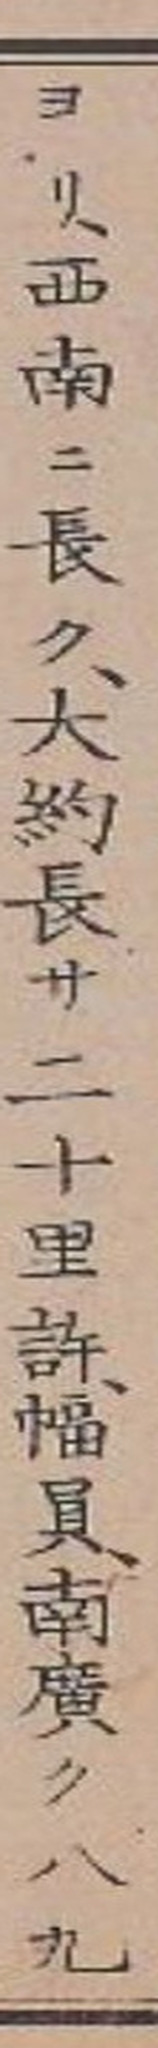ヨリ、西南ニ長ク、大約長サ二十里許、幅員、南広ク八九
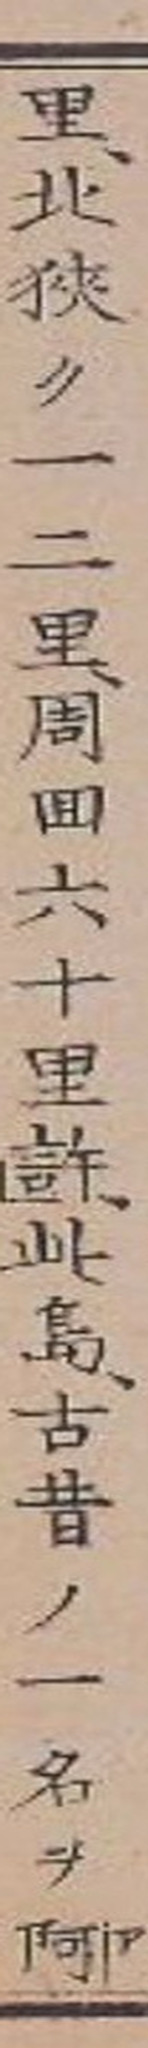里、北狭ク一二里、周回六十里許、」此島、古昔ノ一名ヲ阿
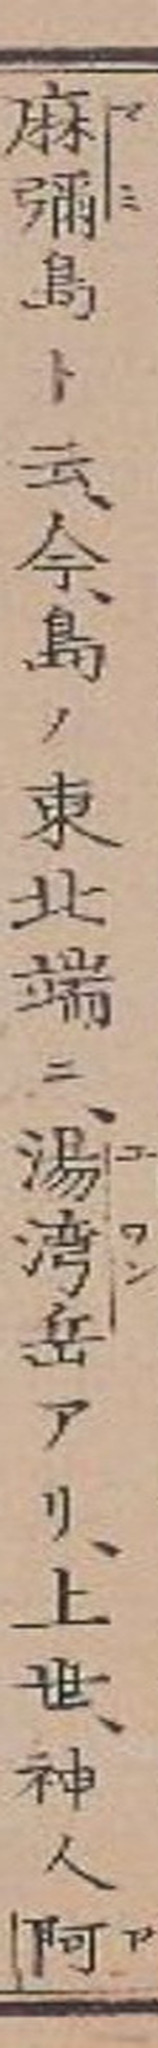麻弥島ト云、今、島ノ東北端ニ、湯湾岳アリ、上世、神人阿
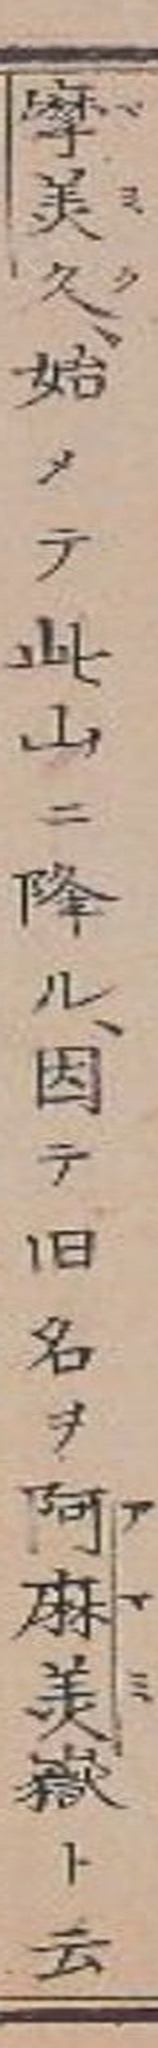摩美久、始メテ此山ニ降ル、因テ旧名ヲ阿麻美岳ト云
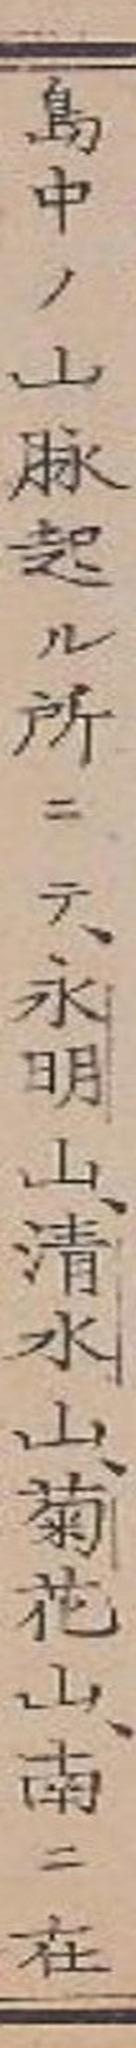島中ノ山脈起ル所ニテ、永明山、清水山、菊花山、南ニ在
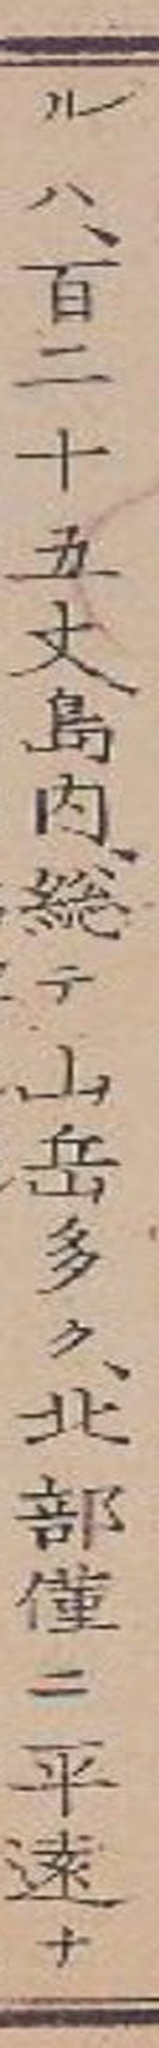ルハ、百二十五丈、島内、総テ山岳多ク、北部僅ニ平遠ナ
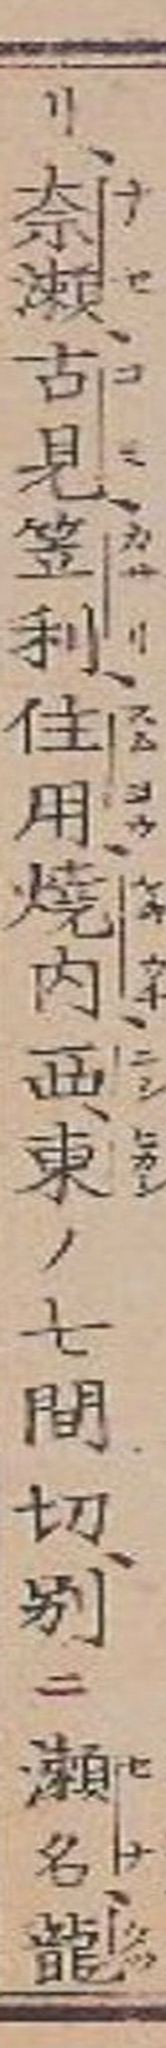リ、奈瀬、古見、笠利、住用、焼内、西、東ノ七間切、別ニ瀬名、竜
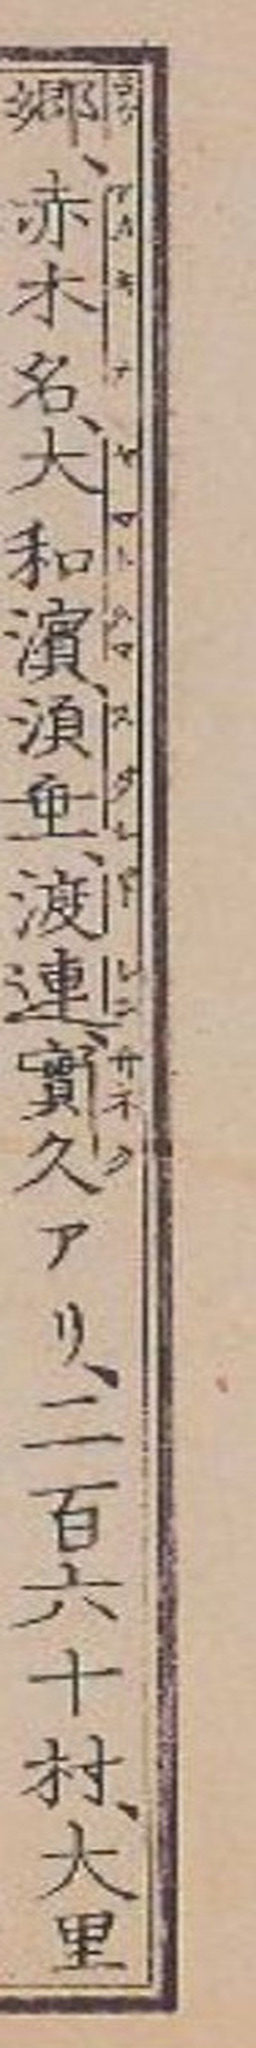郷、赤木名、大和浜、須垂、渡連、実久アリ、二百六十村、大里
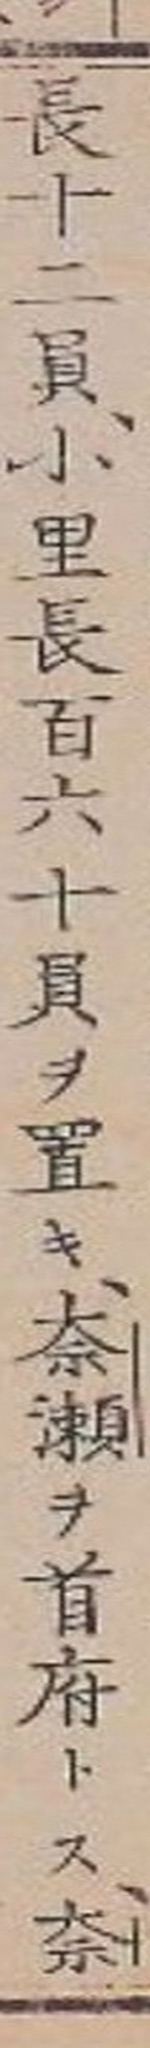長十二員、小里長百六十員ヲ置キ、奈瀬ヲ首府トス、奈
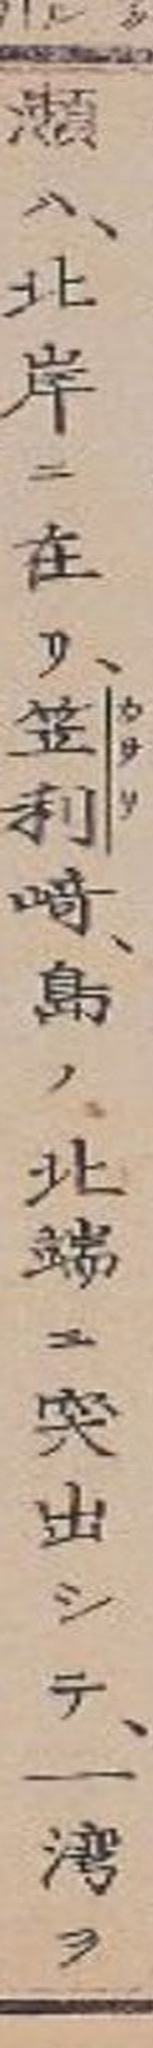瀬ハ、北岸ニ在リ、笠利崎、島ノ北端ニ突出シテ、一湾ヲ
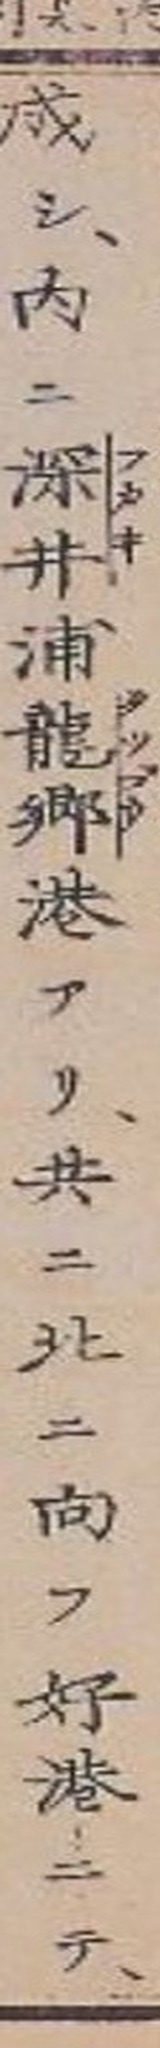成シ、内ニ深井浦竜郷港アリ、共ニ北ニ向フ好港ニテ、
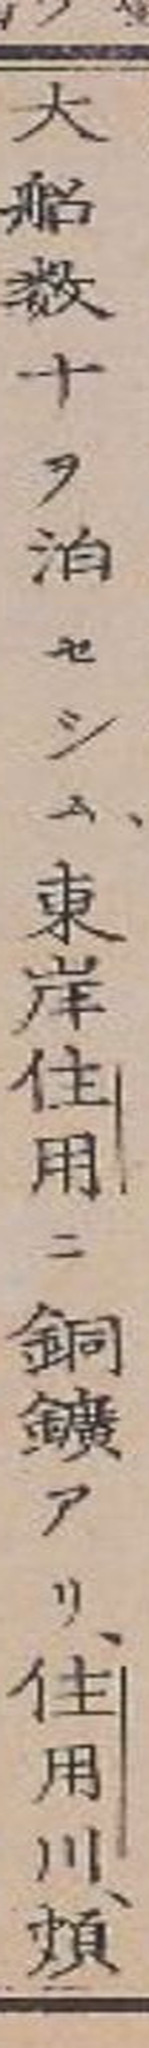大船数十ヲ泊セシム、東岸住用ニ銅鉱アリ、住用川、頗
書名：琉球新誌 巻上
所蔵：University of the Ryukyus Library
